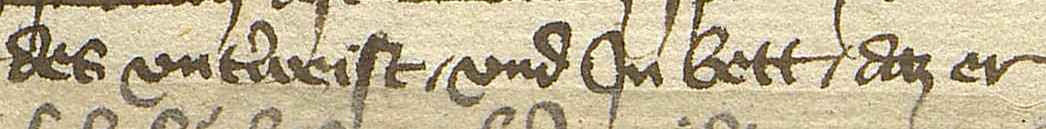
des vnt*weiſt / vnd In bett / daʒ er
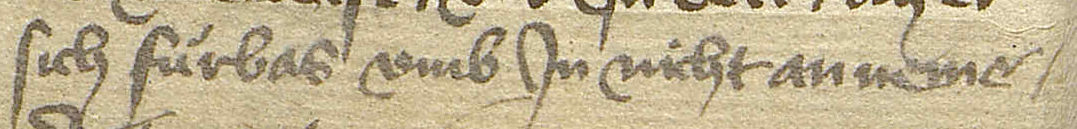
ſich fürbas vmb In nicht anneme /
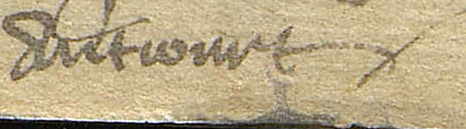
Antwurt /
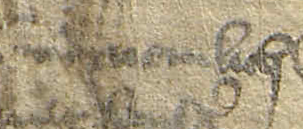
vnd nemlich
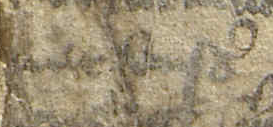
mit vnſs*
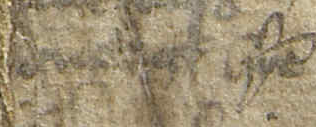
gnedig* h*re*
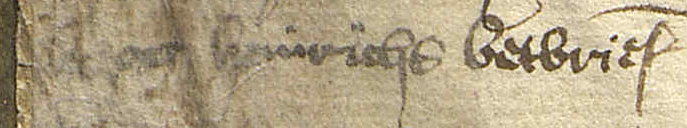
herʒog heinrichs betbrief
